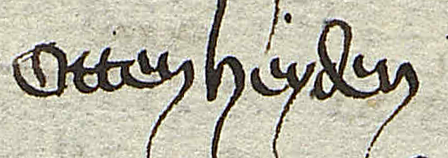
Otten Heyden
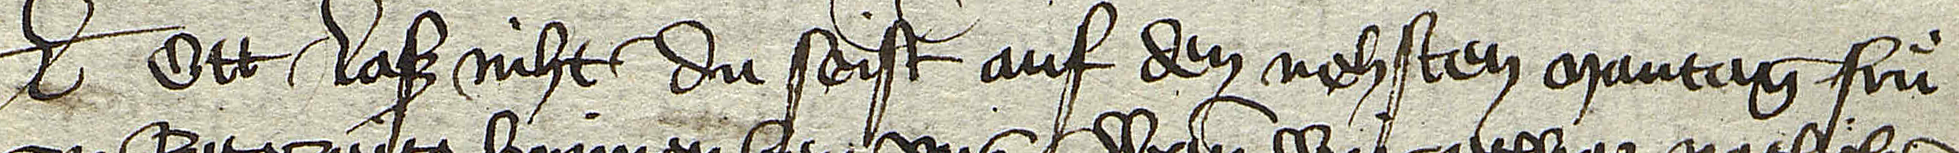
L* Ott / Laſʒ niht / du ſeiſt auf den nehſten Montag frü
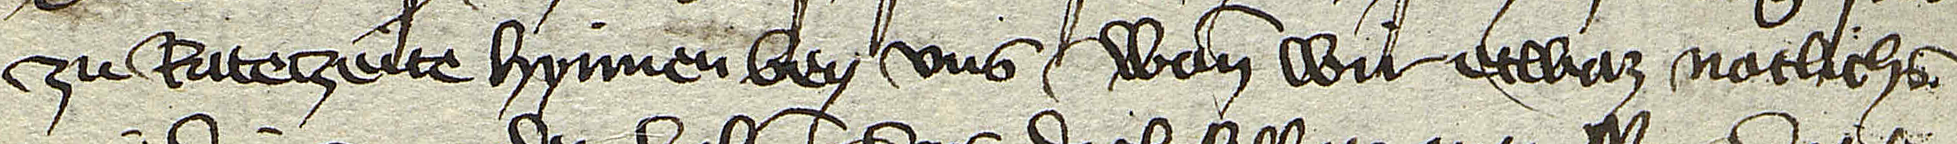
cʒu Ratecʒeite hynnen bey vns / wan* wir etwaʒ notlichs
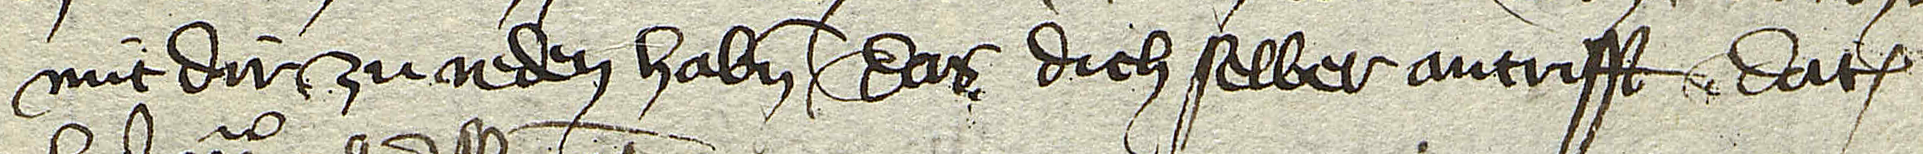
mit dir cʒu reden habn* / das dich ſelber antrifft / . Dat*
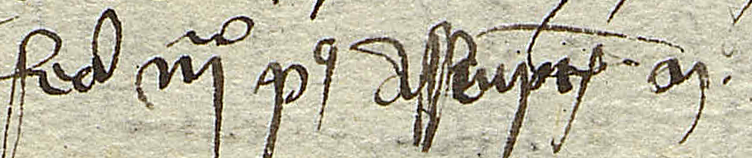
fea* iii* p* Aſſupt* . M .
